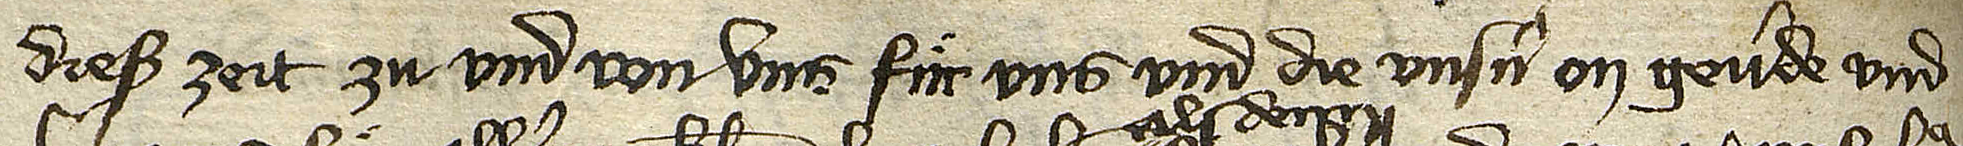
dieſ* ʒeit ʒu vnd von vns für vns vnd die vnſ*n on geu*de vnd
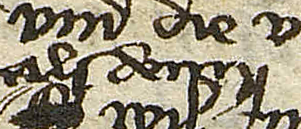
alſdenn
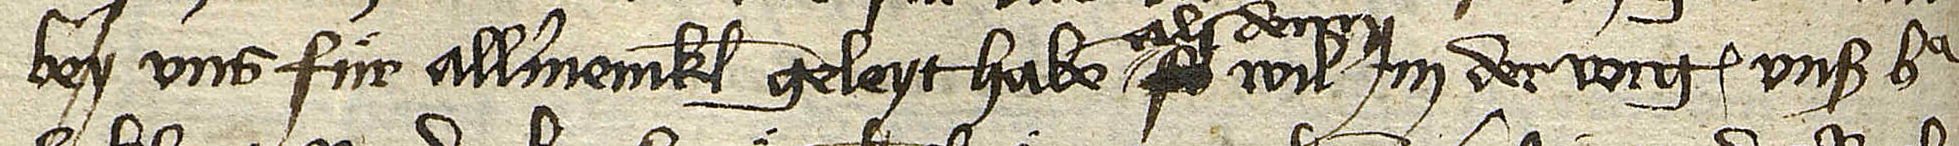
bey vns für all*menikl* geleyt habe* / ſo wil Im der vorg* vnſ* b*
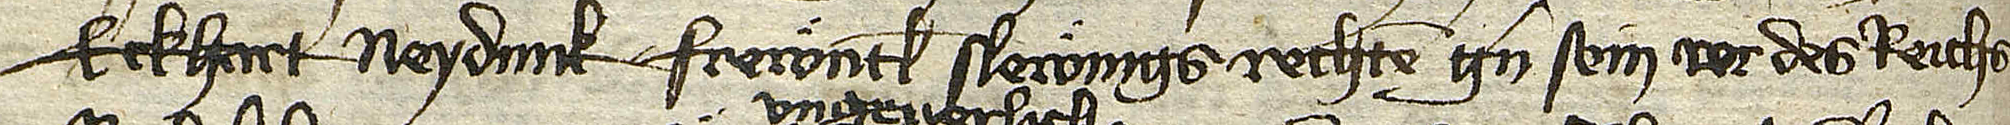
Eckhart Neydunk freẅntl* ſleẅings rechte* g*n ſein vor des Reichs
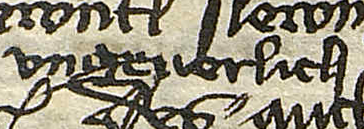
vngeuerlich
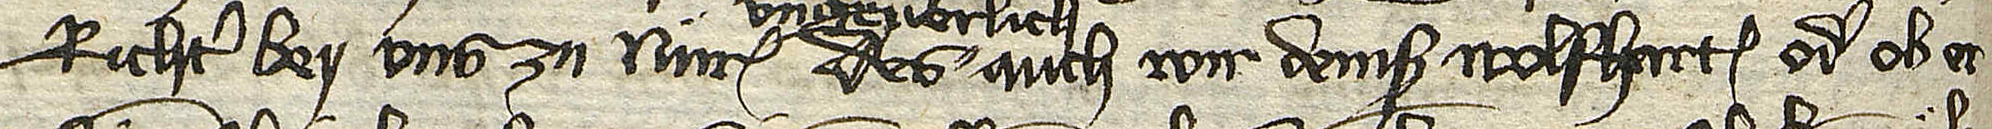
Richt* bey vns ʒu Nür* Des auch wir demſ* wolfhart* od* ob er
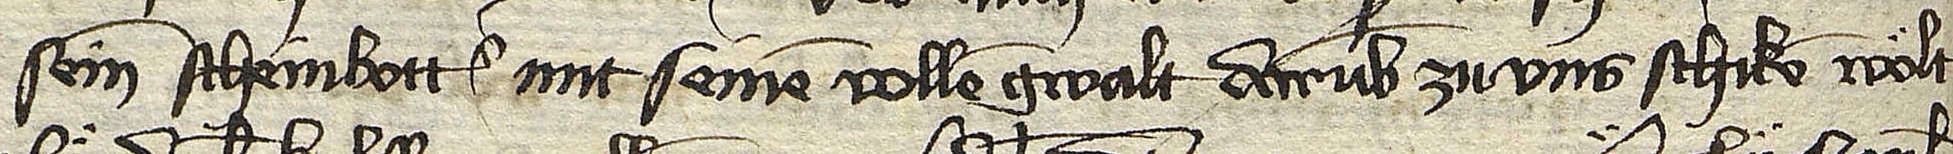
ſein* ſcheinbott* mit ſeine* volle* gwalt darub* ʒu vns ſchike* wölt
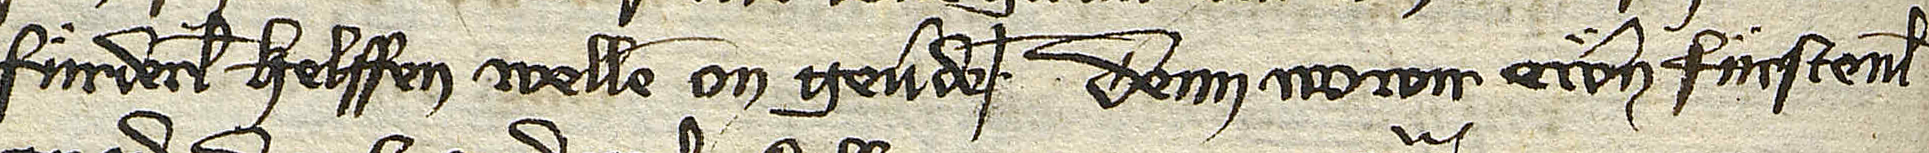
fürderl* helffen welle* on geu*de . Denn wo wir eẅn* fürſtenl*
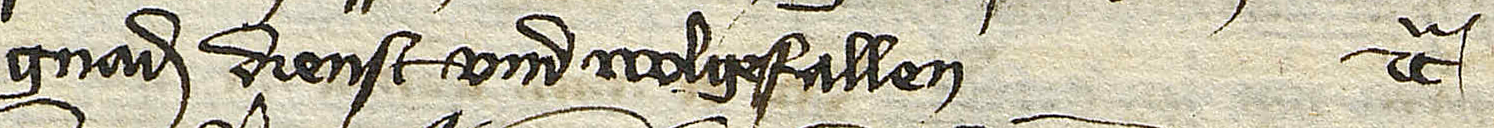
gnad* dienſt vnd wolgefallen ec*
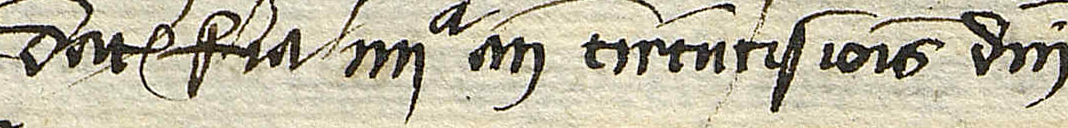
Dat f*ia iiii* an* circu*ciſiois* dni*
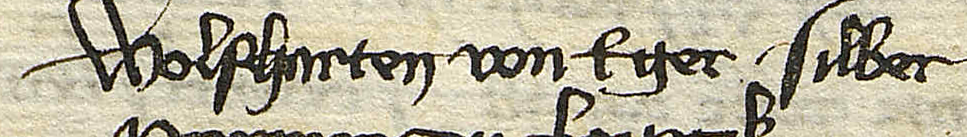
Wolfharten von Eger / ſilber
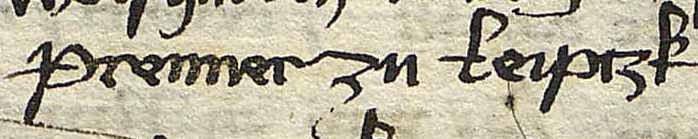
Prenner ʒu Leipcʒk
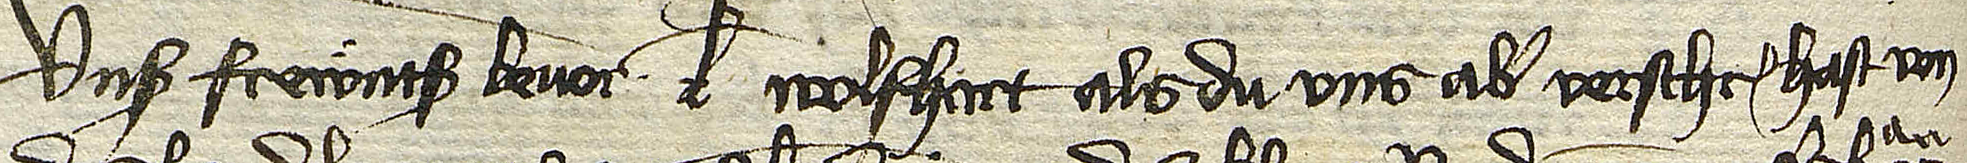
Vnſ* freẅntſ* beuor* l* wolfhart als du vns ab* verſchr*haſt von
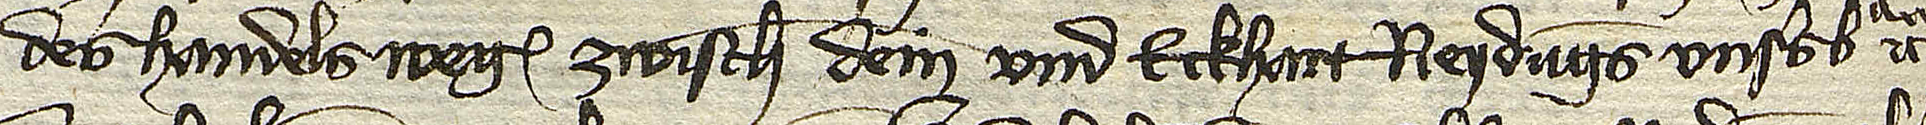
des handels weg* ʒwiſch* dein vnd Eckhart Neydu*gs vnſ*s b* ec*
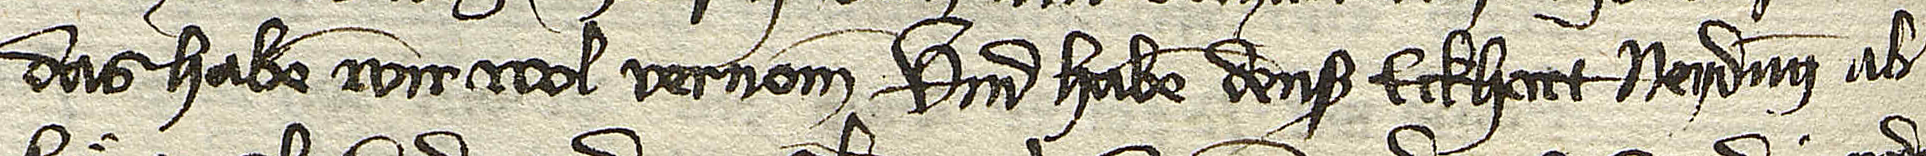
das habe* wir wol vernom* Vnd habe* denſ* Eckhart Neyd*ug ab*
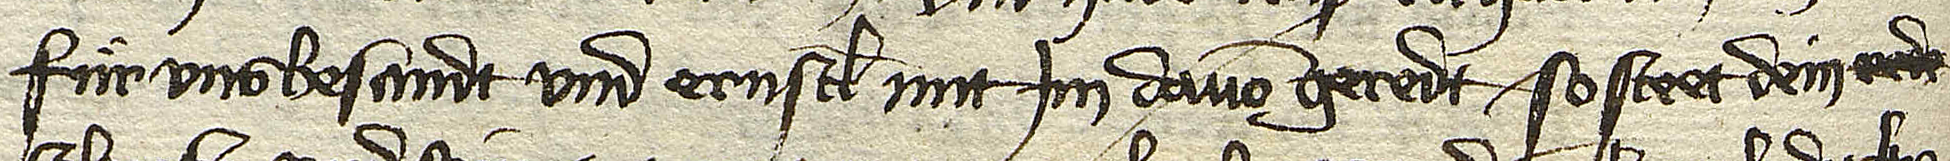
für vns beſandt vnd ernſtl* mit Im dauo* geredt / ſo ſteet dein rede
